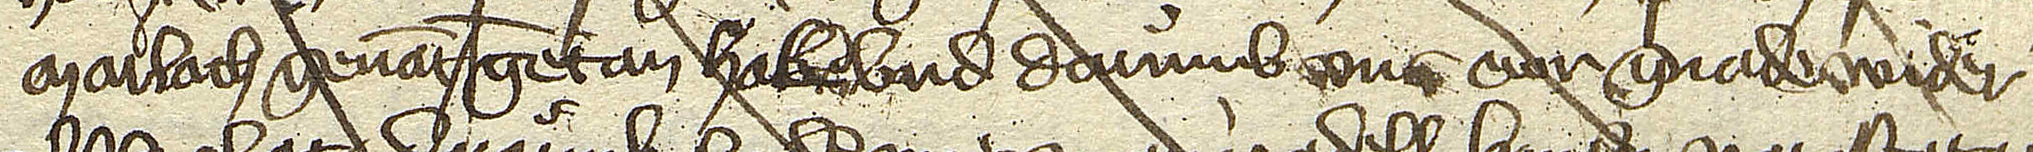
Marlach genat* getan hab / vnd darümb vns ewr gnade* wider
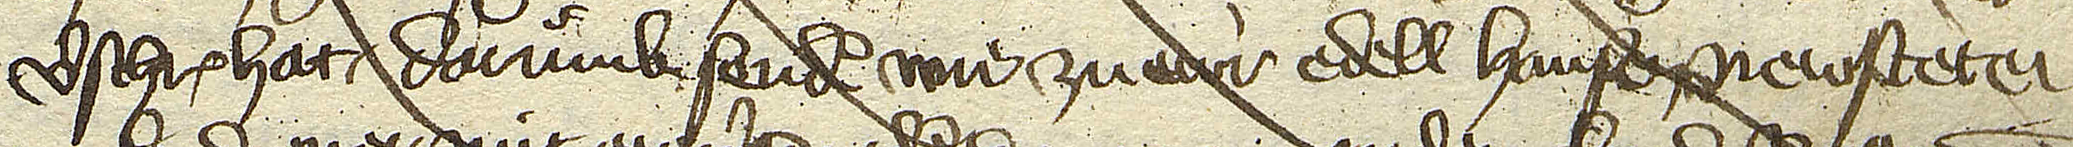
v*ſchr* hat / darümb ſende* wir cʒu ewr edell hanſen Newſteter
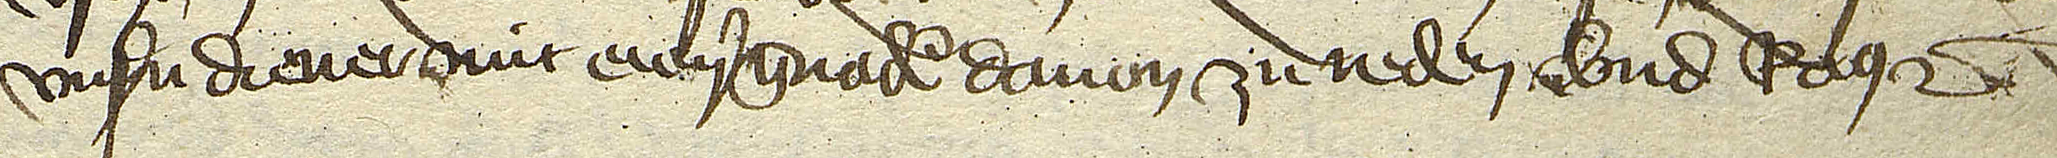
vnſ*n diener mit ewn* gnade* dauon cʒu reden / vnd Ro* ec*
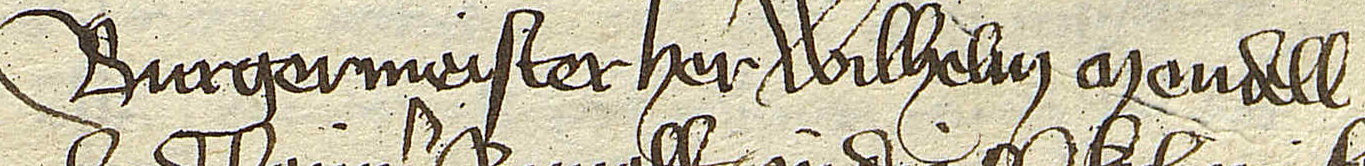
Burgermeiſter Her Wilhelm Mendell
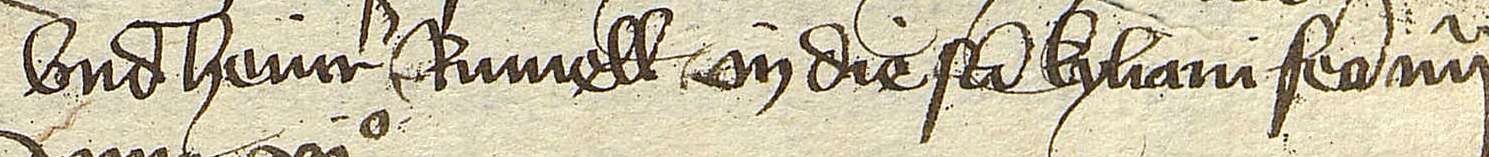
vnd heinr* Rumell in die ſci* kyliani fea* iiii*
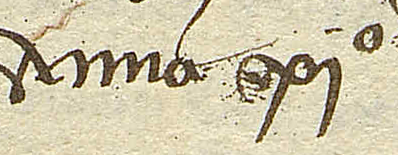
Anno xi*
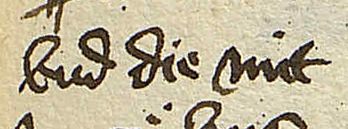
vnd die mit
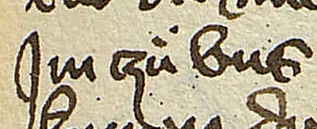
Im cʒü vns
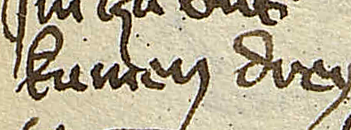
kumen drey
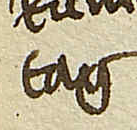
tag
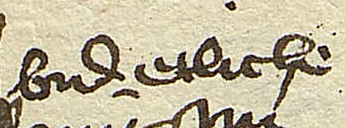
vnd etliche
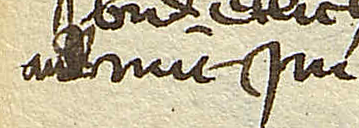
and* mit Im
